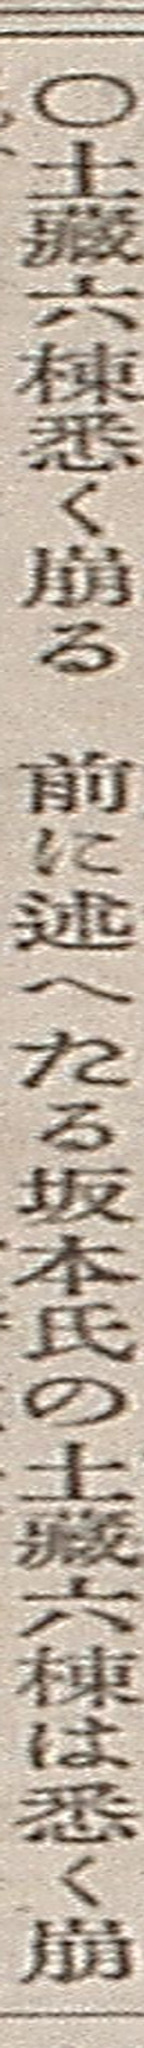〇土蔵六棟悉く崩る前に述へたる坂本氏の土蔵六棟は悉く崩
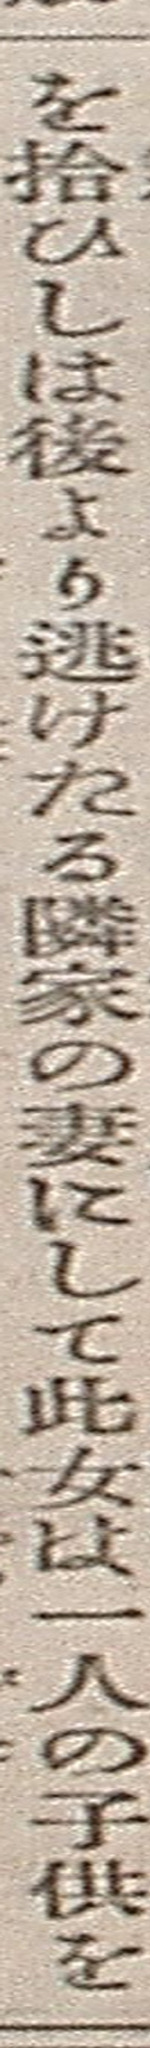を拾ひしは後より逃けたる隣家の妻にして此女は一人の子供を
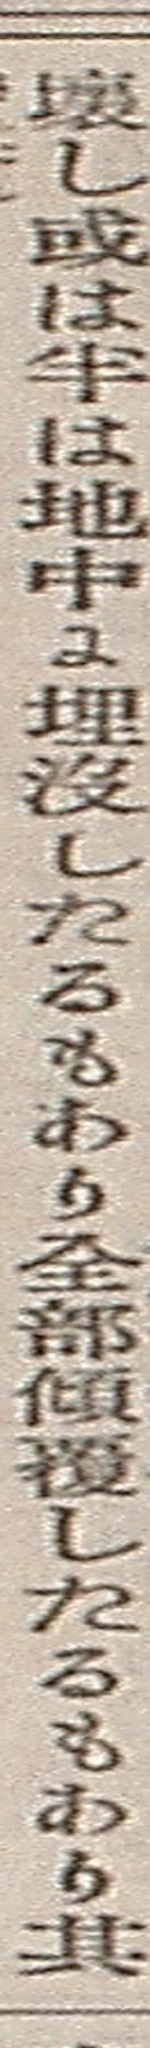壊し或は半は地中に埋没したるもあり全部傾覆したるもあり其
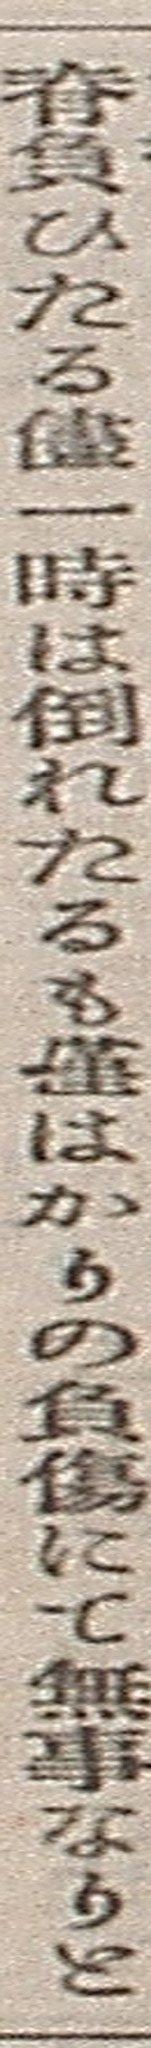背負ひたる侭一時は倒れたるも僅はかりの負傷にて無事なりと
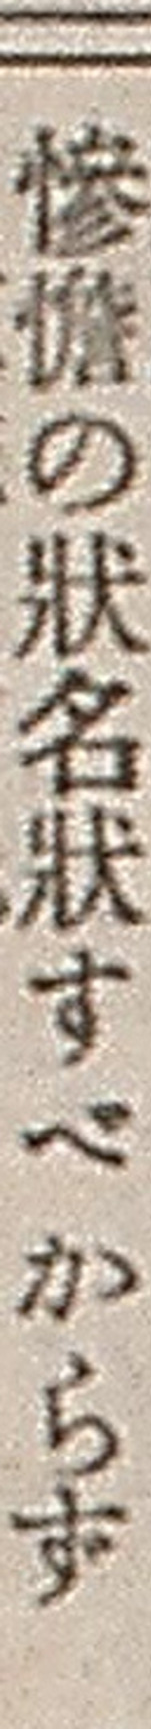惨憺の状名状すべからず
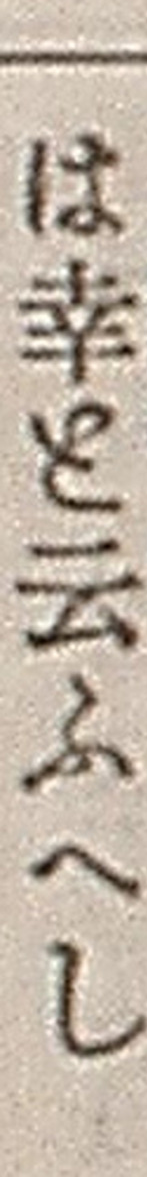は幸と云ふへし
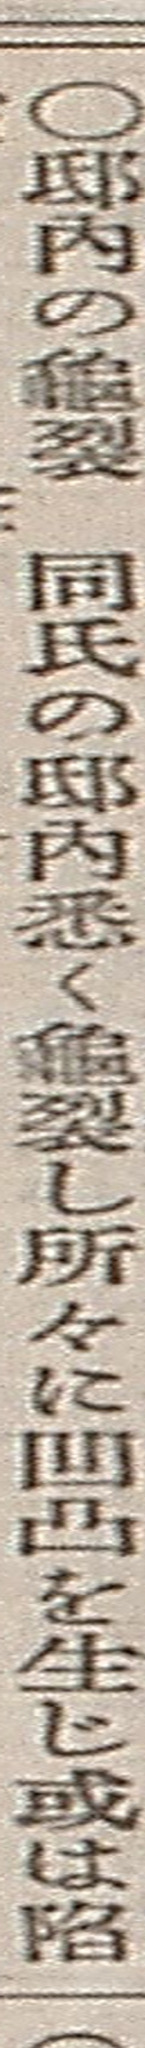〇邸内の亀裂同氏の邸内悉く亀裂し所々に凹凸を生じ或は陥
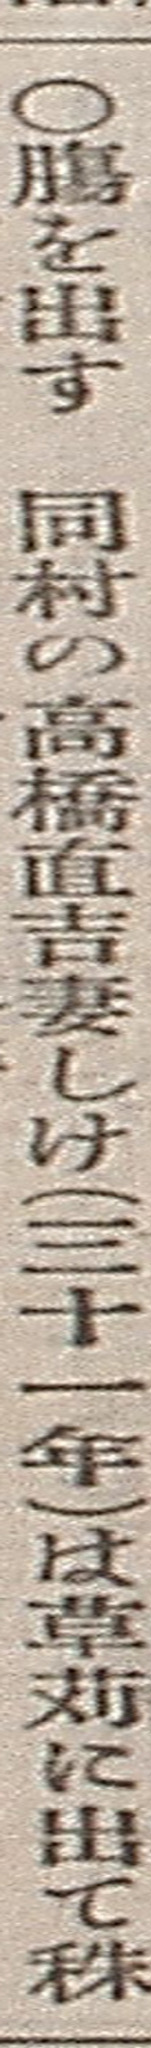〇腸を出す同村の高橋直吉妻しけは草苅に出て秣
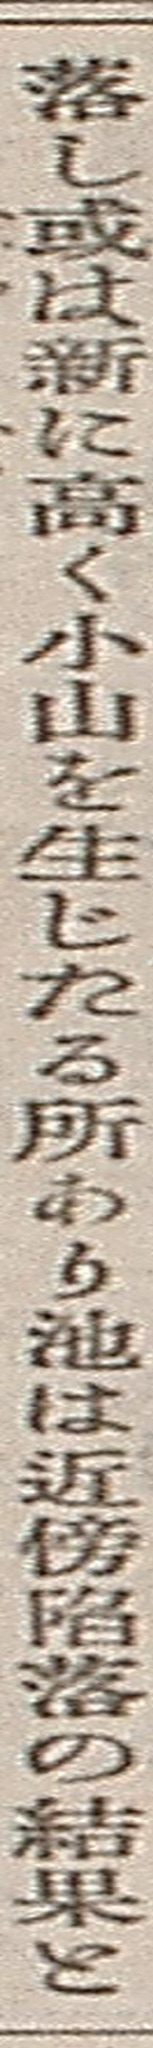落し或は新に高く小山を生じたる所あり池は近傍陥落の結果と
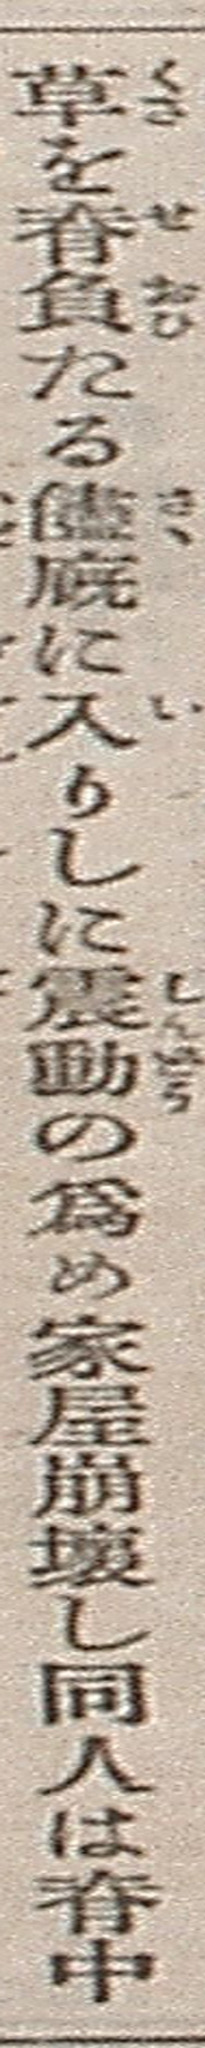草を背負たる侭厩に入りしに震動の為め家屋崩壊し同人は背中
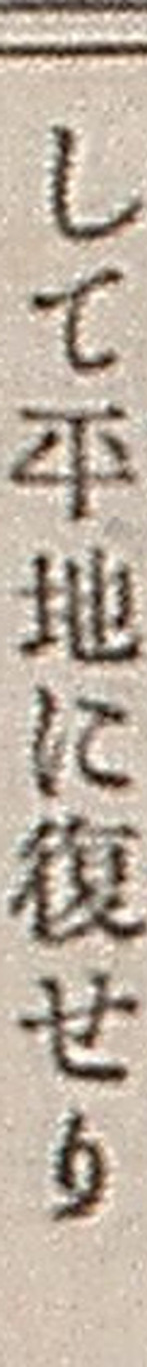して平地に復せり
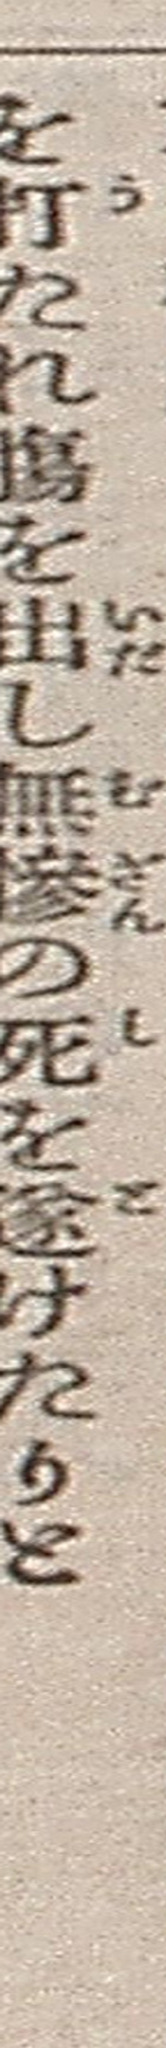を打たれ腸を出し無惨の死を遂けたりと
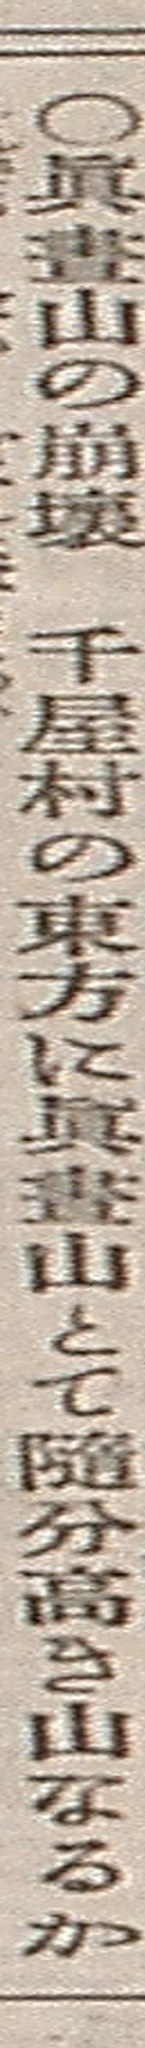〇真昼山の崩壊千屋村の東方に真昼山とて随分高き山なるか
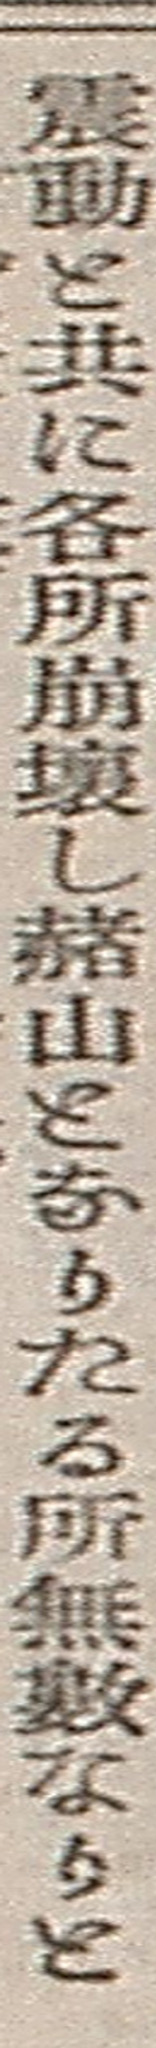震動と共に各所崩壊し赭山となりたる所無数なりと
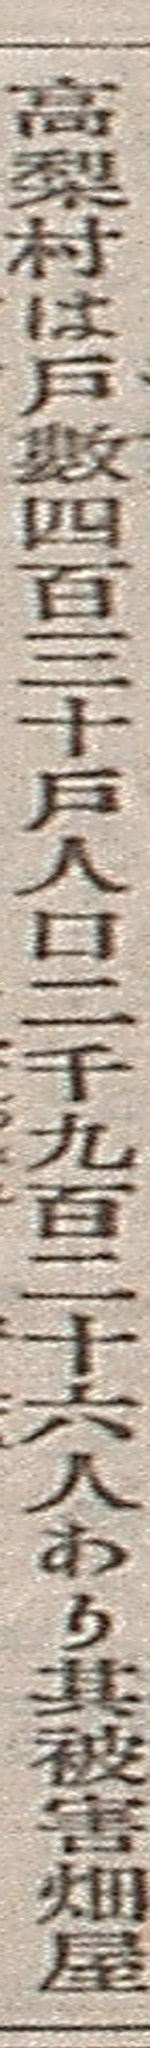高梨村は戸数四百三十戸人口二千九百二十六人あり其被害畑屋
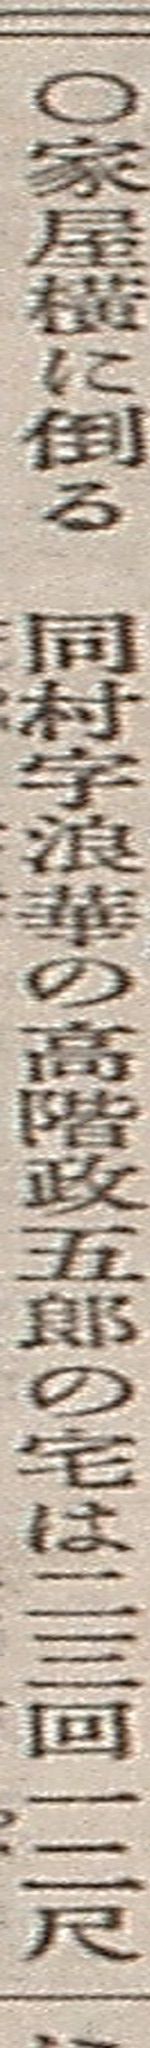〇家屋横に倒る同村字浪華の高階政五郎の宅は二三回一二尺
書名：風俗畫報臨時増刊第百二十四號　洪水地震被害録（上）
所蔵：東京大学地震研究所図書室 Earthquake Research Institute Library, The University of Tokyo, JAPAN
